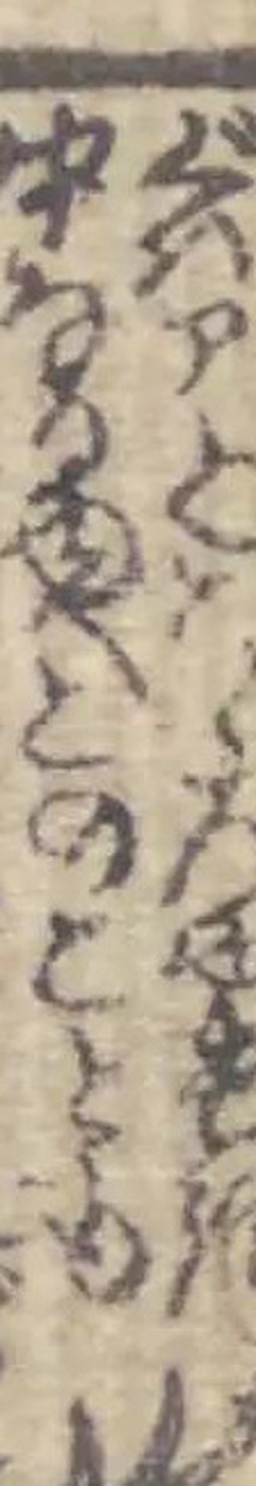中なりゆへこのことも
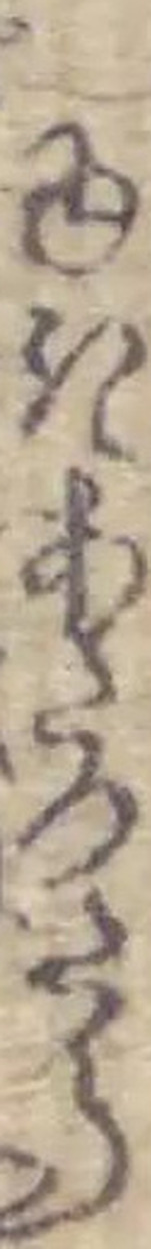ゆきあたつたら
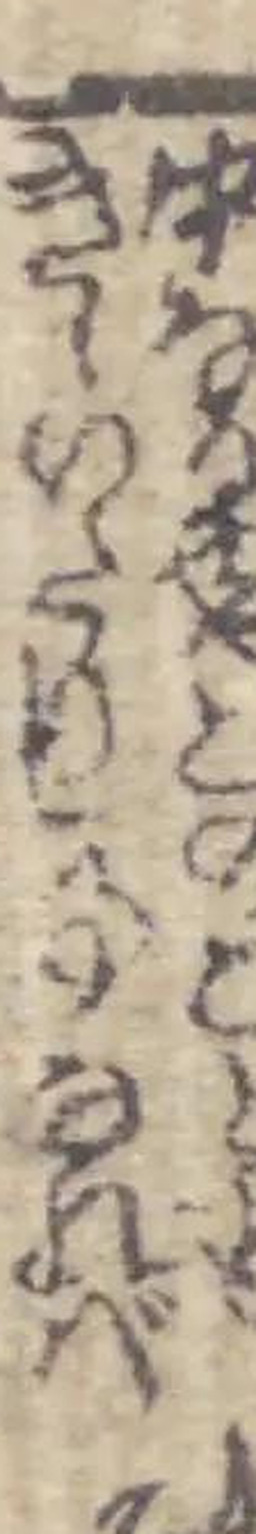きゝいたりし事なれば
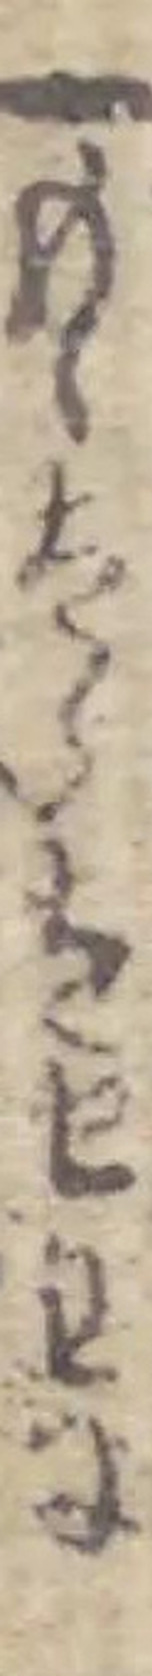もゝ太郎をせわに
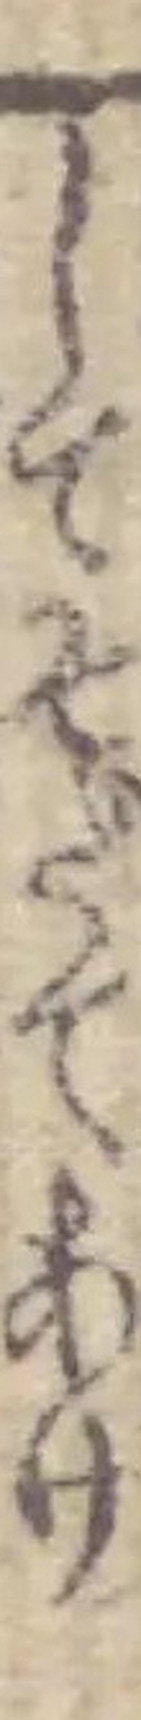してそだてあけ
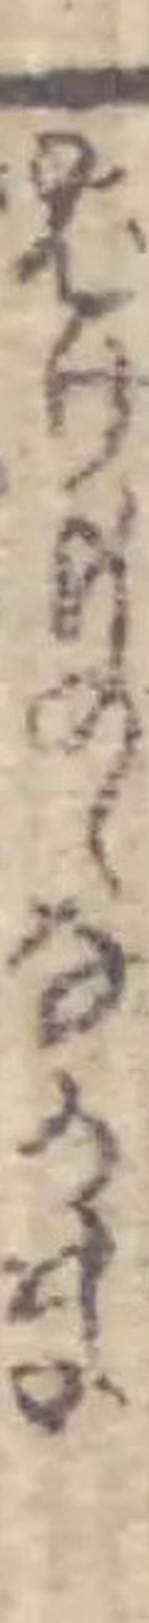ばけものゝなかま
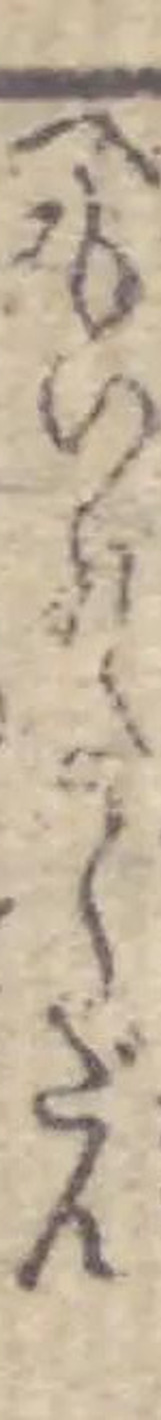へもいれたくだん
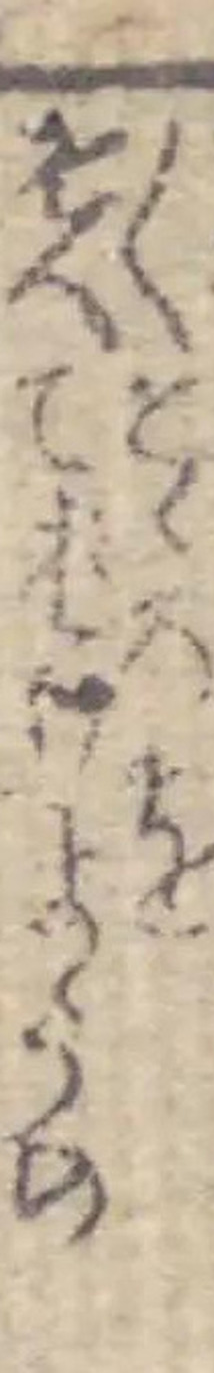そへてばけようの
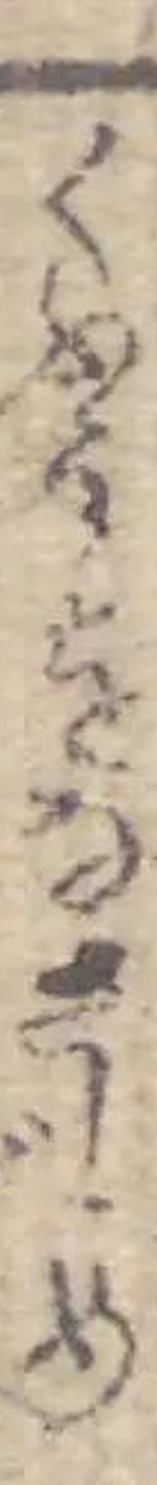くふうをなさしめ
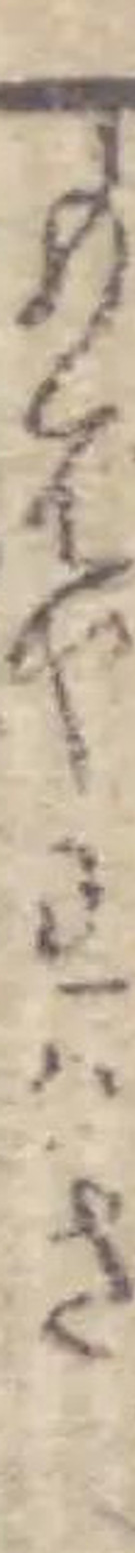もはやしわるざ
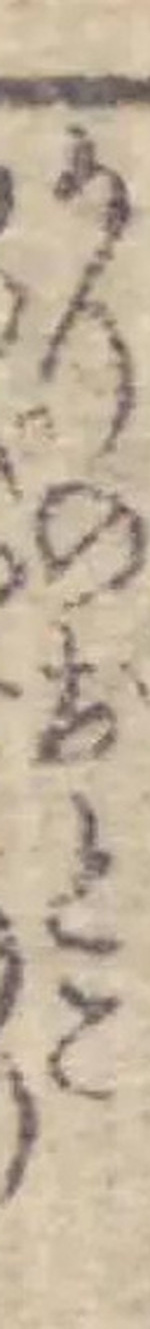かりのおとこ
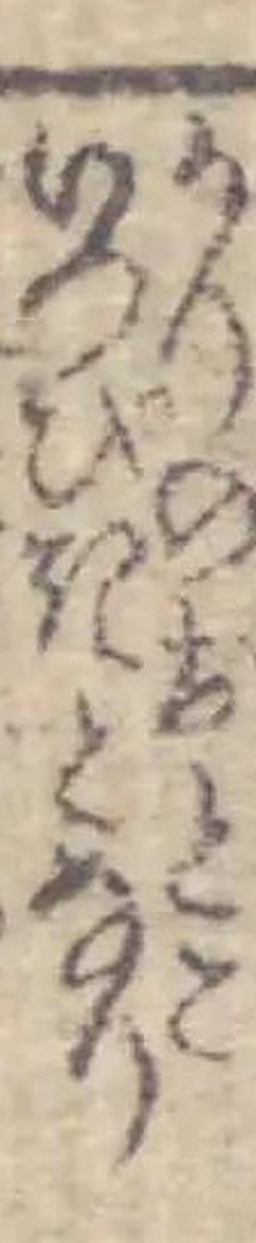いつぴきとなり
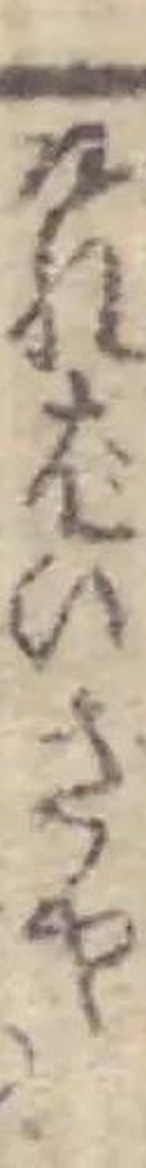ければいざや
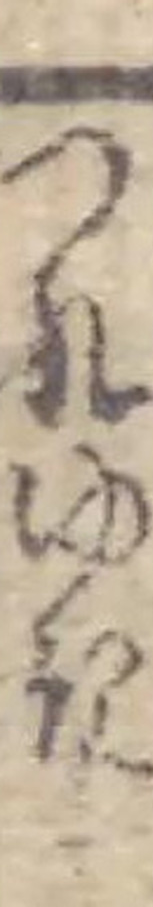つれゆき
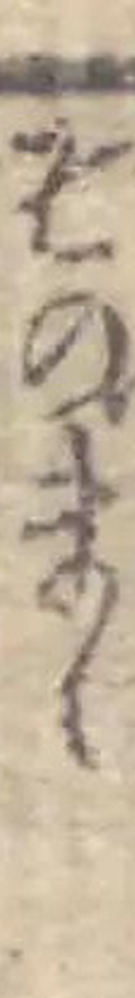そのまゝ
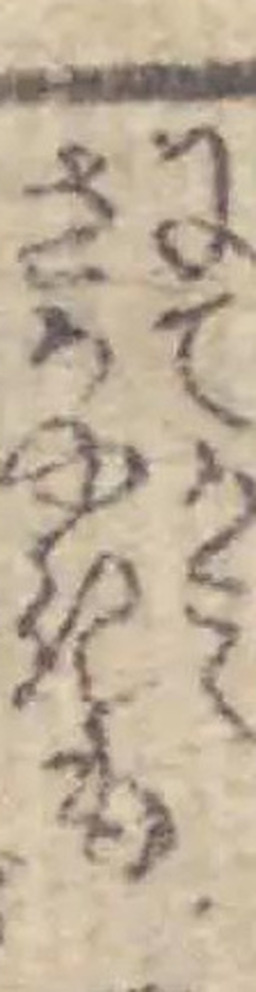さかやきも
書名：化物尽 4巻
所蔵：国立国会図書館 National Diet Library, JAPAN
